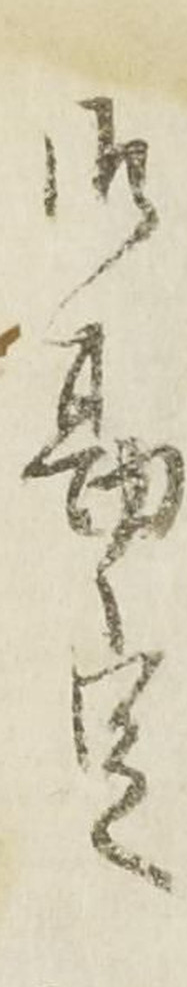御勘定
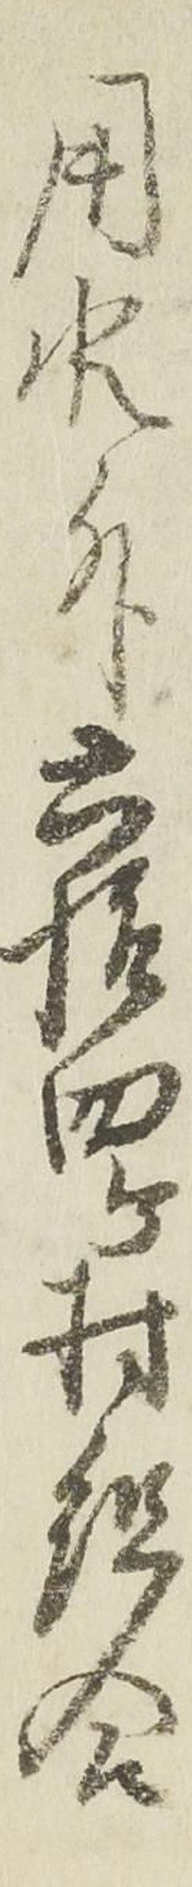用水外六拾四ケ村組合
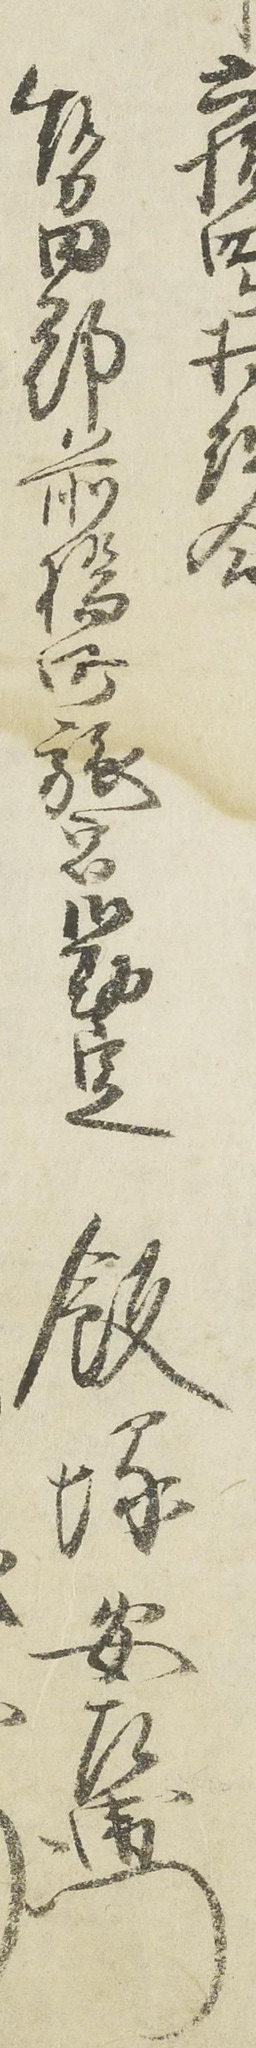勢田郡前橋町旅宿御勘定飯塚安左衛門
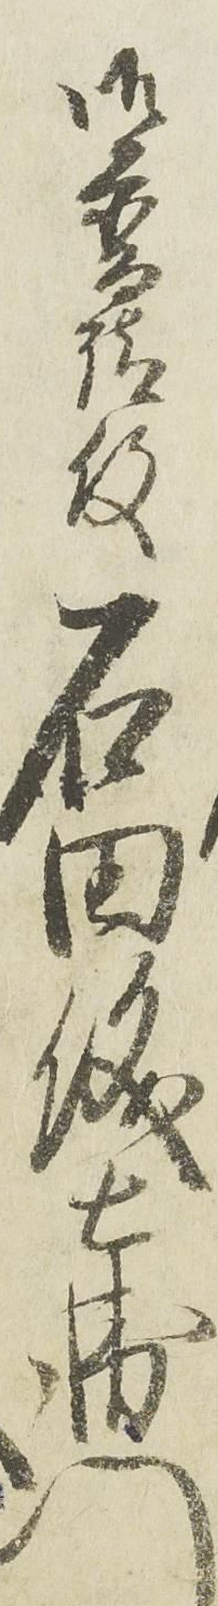御普請役石田儀右衛門
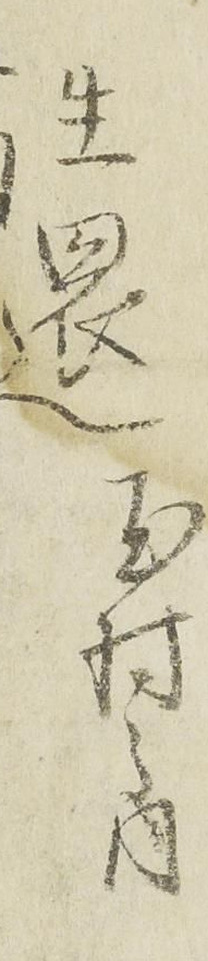往還玉村の内
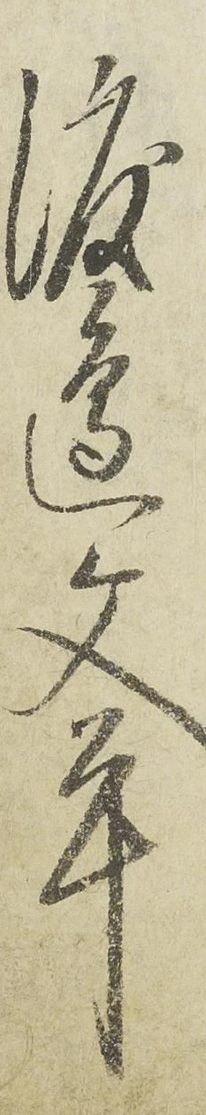渡辺文平

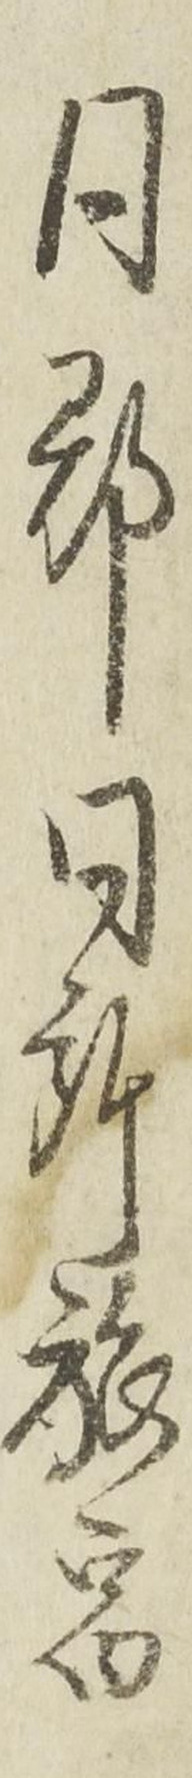同郡同所旅宿
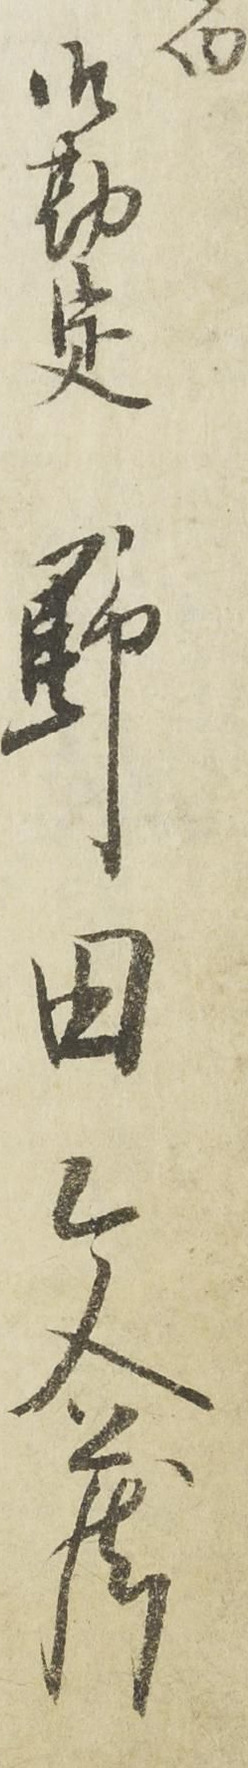御勘定野田文蔵
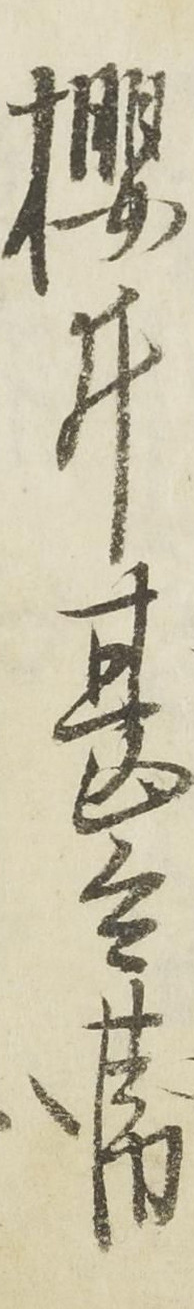桜井甚兵衛
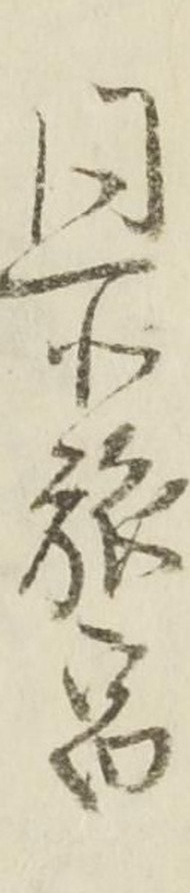同所旅宿
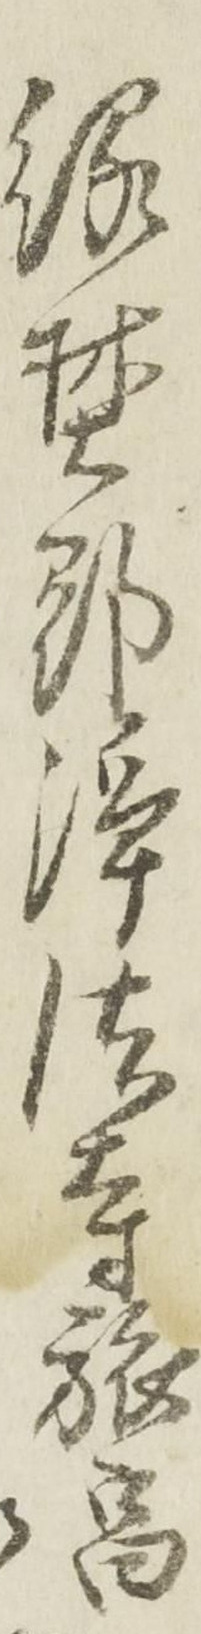縁埜郡浄法寺旅宿
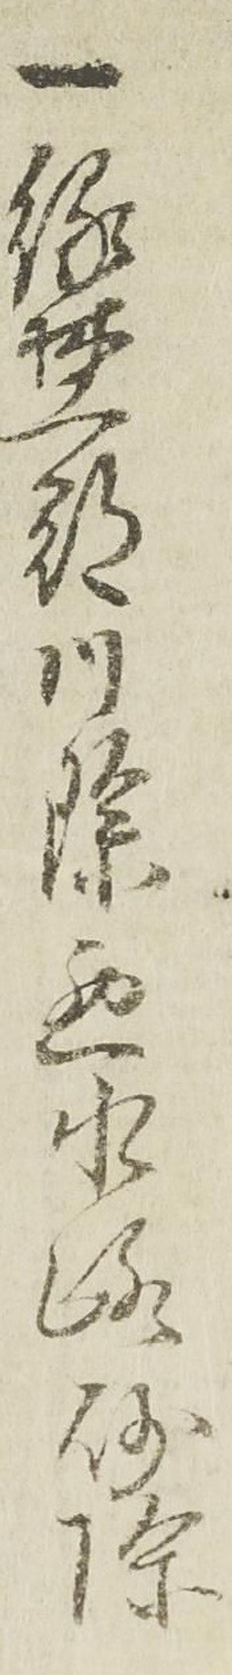一縁埜郡川除西水路砂除
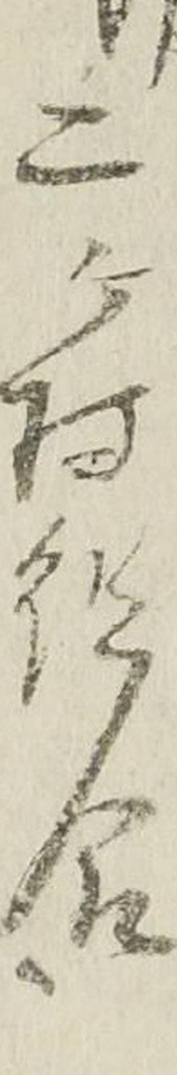八ケ村組合
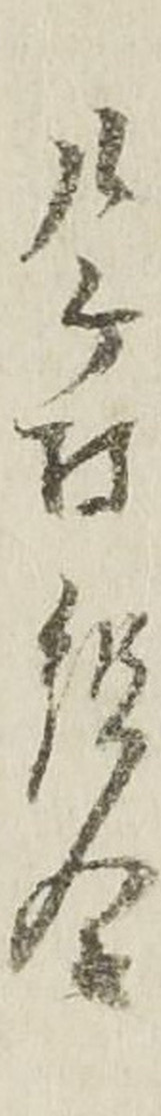八ケ村組合

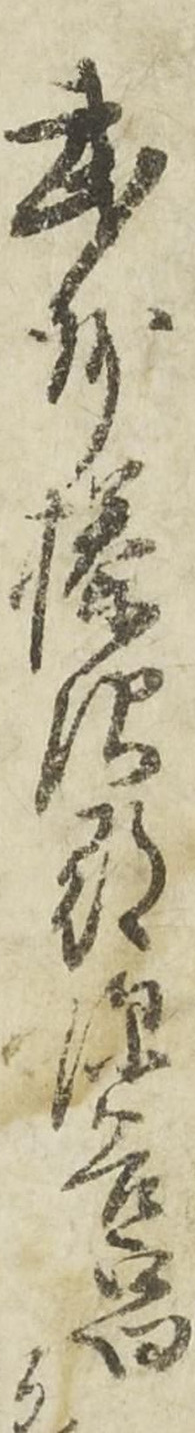武州榛沢郡深谷宿
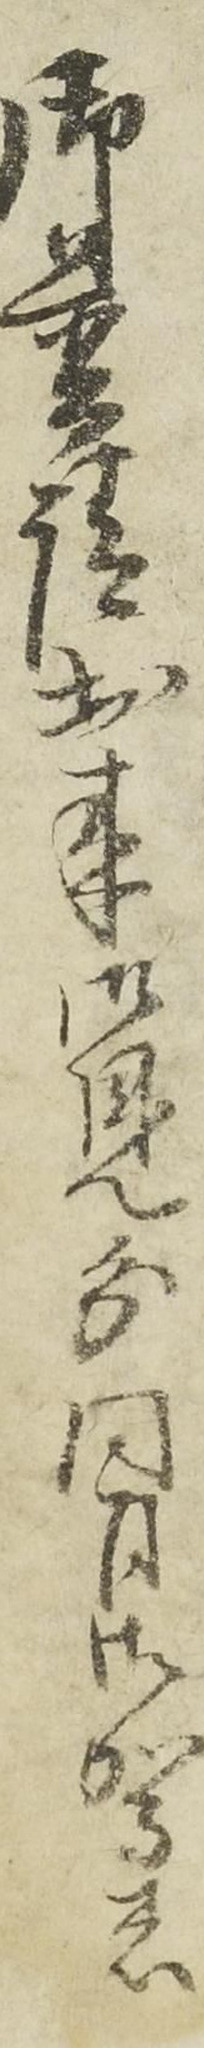御普請役出来御見分同月御駕まい
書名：浅間大変略記
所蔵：東京大学地震研究所図書室 Earthquake Research Institute Library, The University of Tokyo, JAPAN
